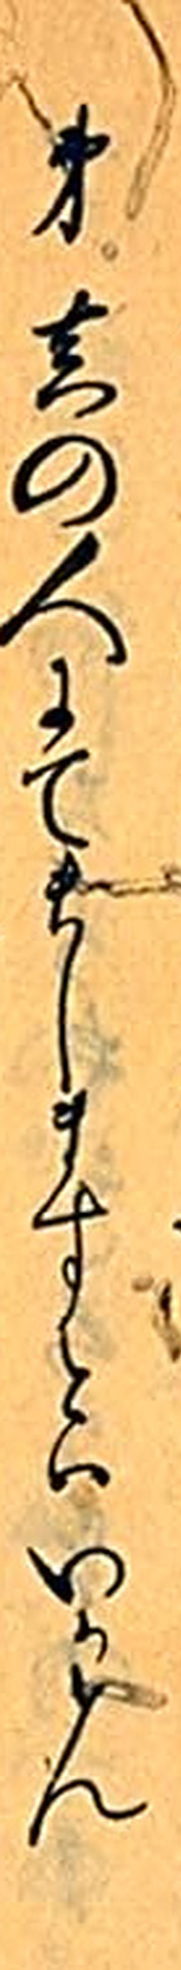弟真の人にてましますとはいかん
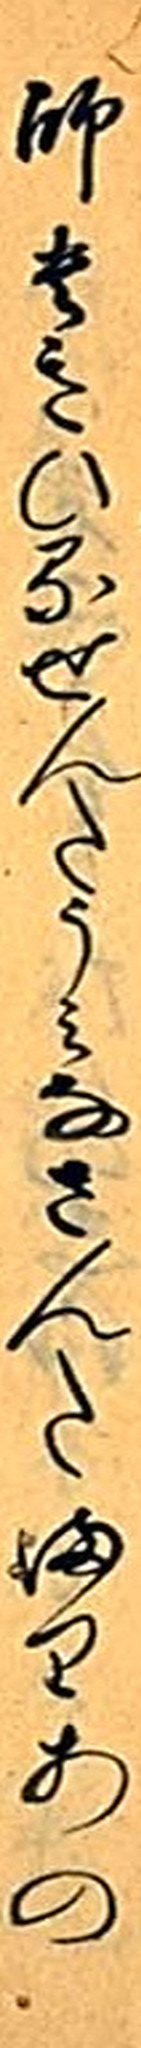師貴きひるせんたうみなさんたまりあの
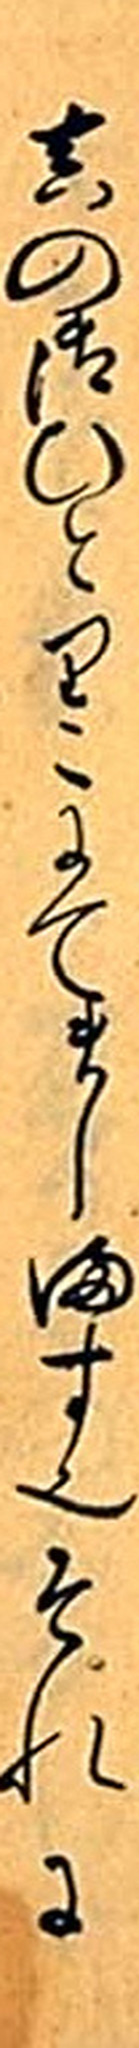真の御ひとりこにてまします也それに
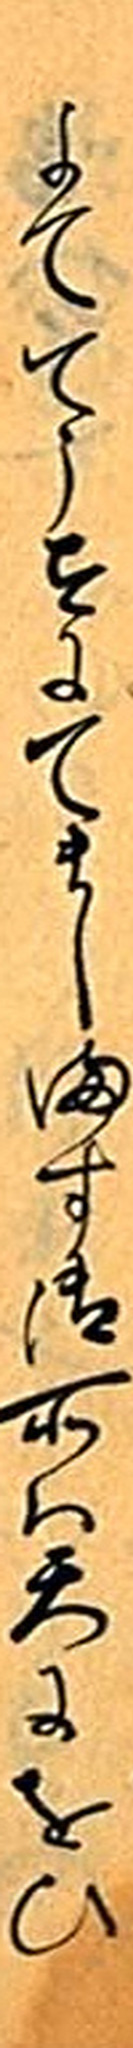よててうすにてまします御所は天にをひ
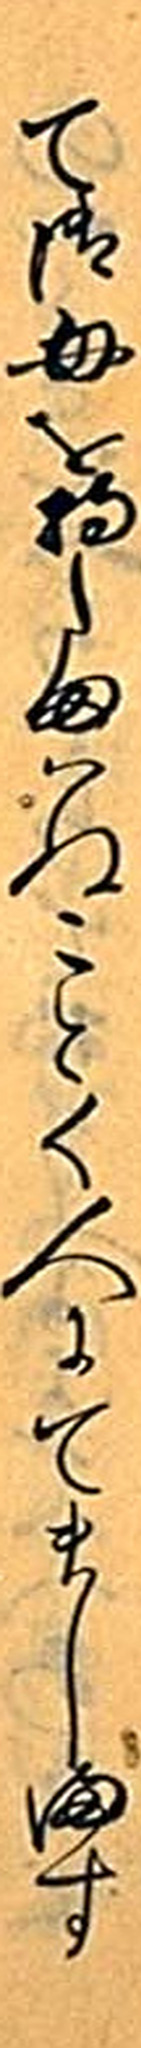て御母を持たまはぬことく人にてまします
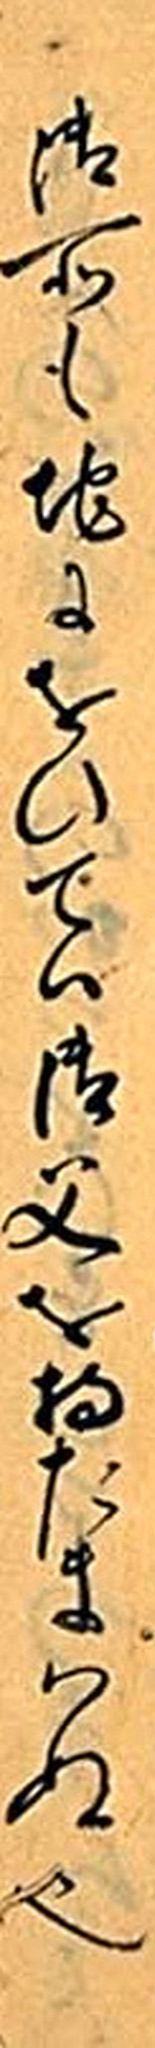御所も地にをひては御父を持たまはぬ也
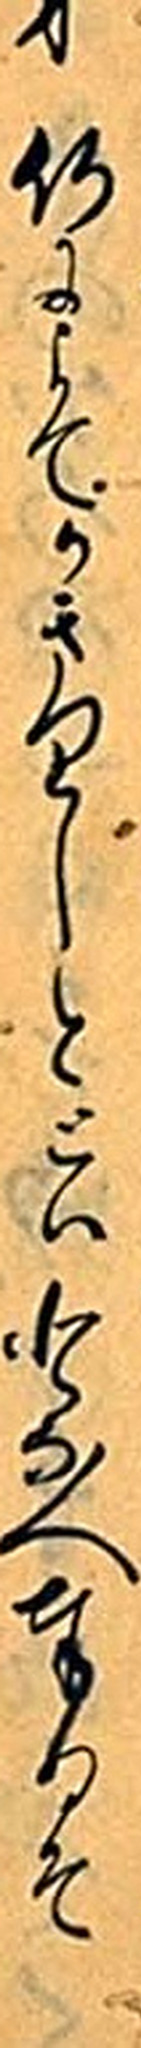弟何によてかきりしととはとなへ奉るそ
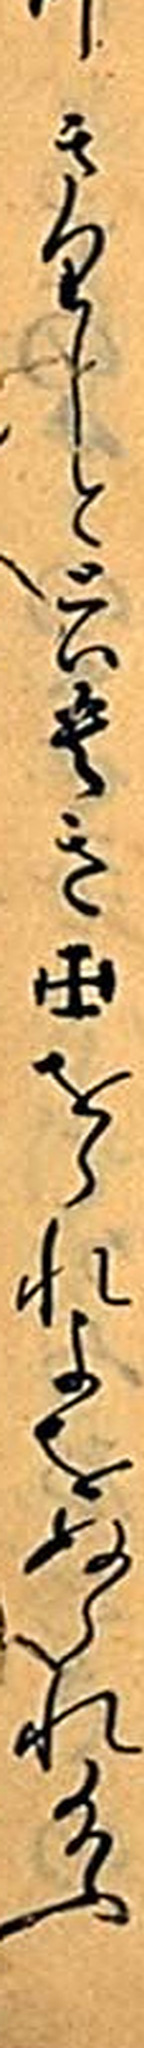師きりしととは貴き☩をられよをぬられ給ふ
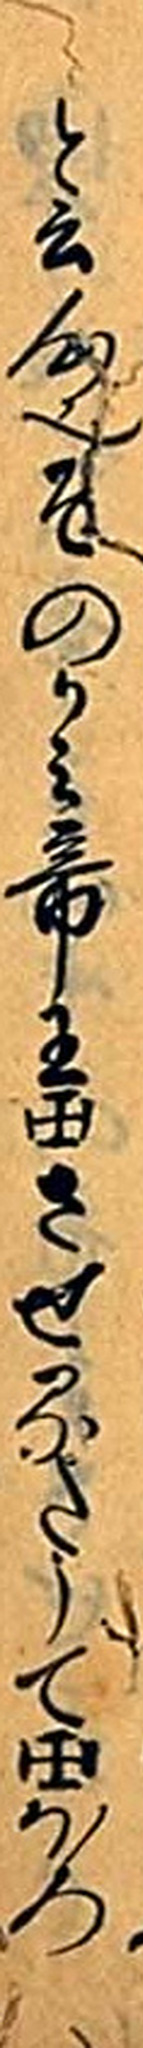と云心也そのかみ帝王☩させるたうて☩ほろ
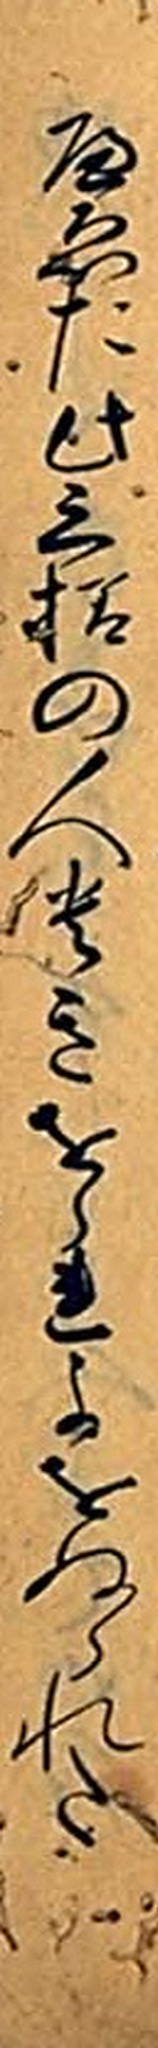へゑた此三様の人貴きをられよをぬられた

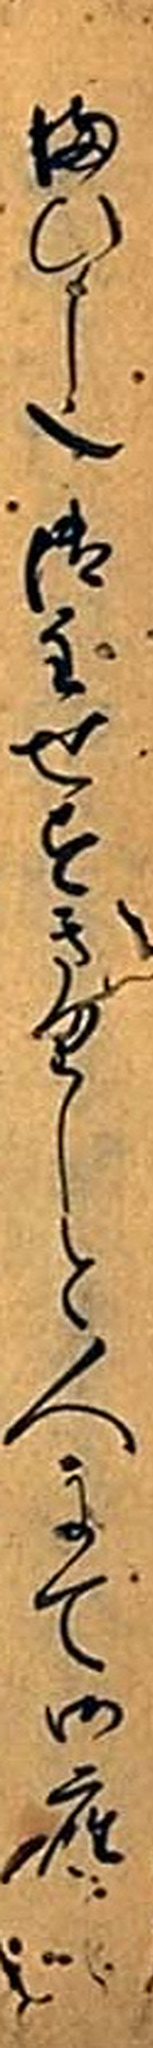まひし也御主せすきりしと人にて御座
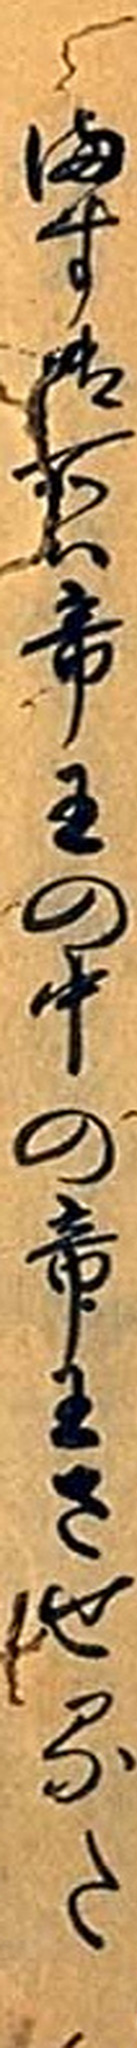ます御所は帝王の中の帝王させるた
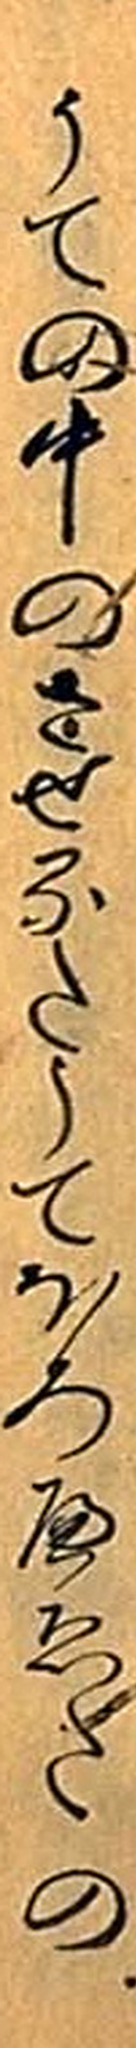うての中のさせるたうてほろへゑたの
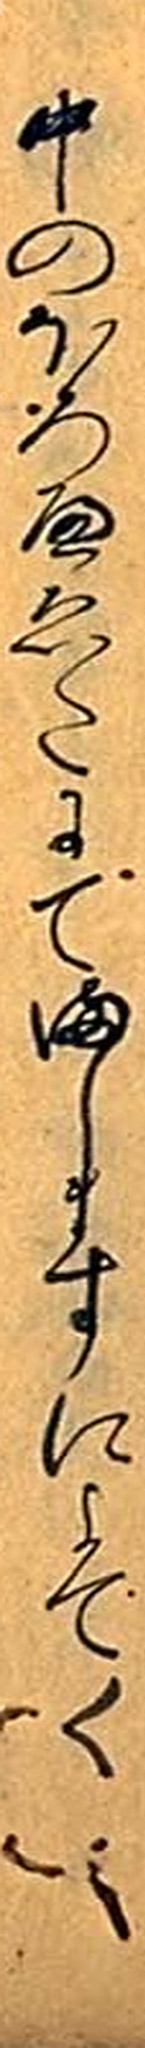中のほろへゑたにてましますによてく
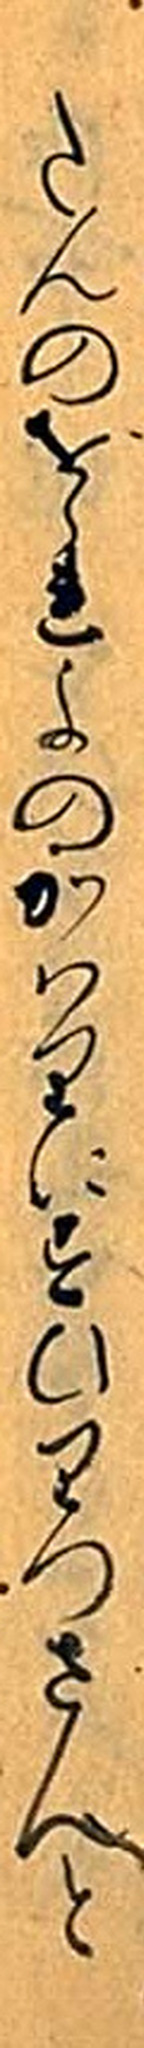たんのをられよのかはりにすひりつさんと
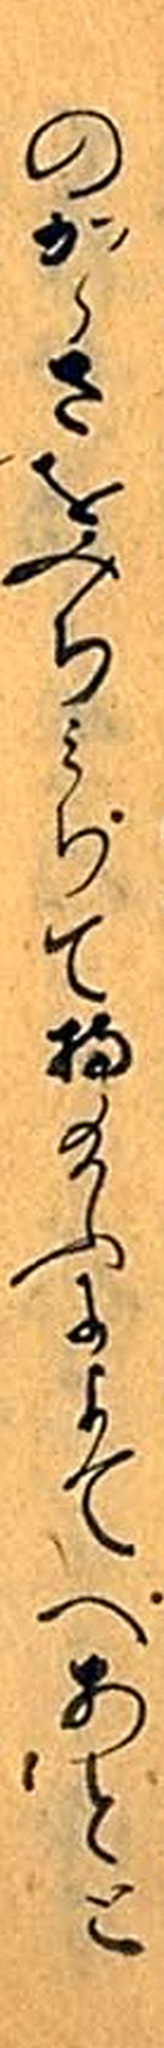のからさをみちみちて持給ふによてへあとと
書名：ドチリナ・キリシタン
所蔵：東京大学総合図書館 / General Library in the University of Tokyo
